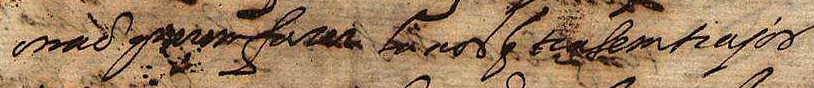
o naõ querem fazer la nos q̄ trasem trajos
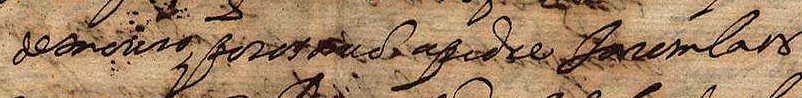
de mouro, por os naõ apedrejarem la os
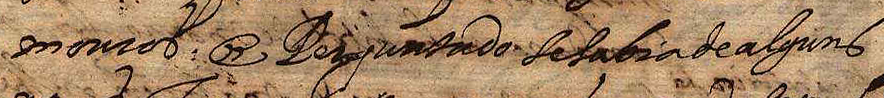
mouros. ⁋ Perguntado se sabia de alguns
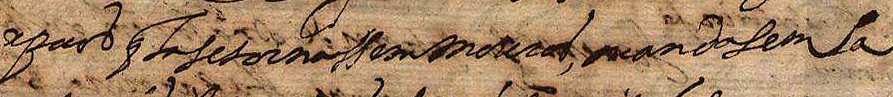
xpaõs q̄ la se tornassem mouros, ou andasem la
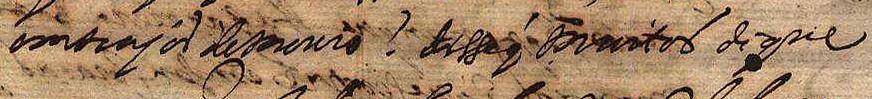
em trajos de mouro? disse q̄ muitos de que
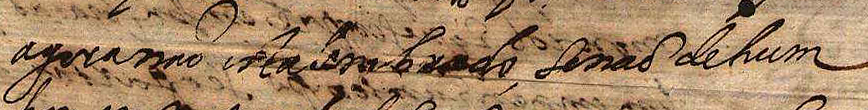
agora naõ esta lembrado, senaõ de hum
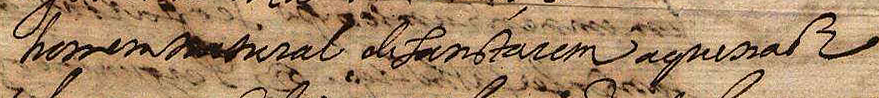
homem natural de sanctarem a que naõ
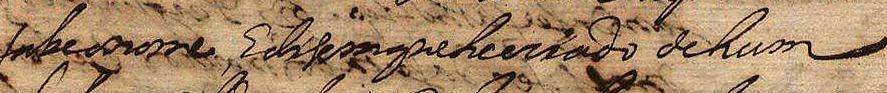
sabe o nome, E disem que he criado de hum
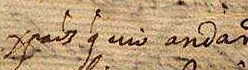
xpaõs q̄ uio andar
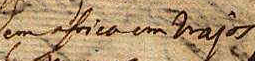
em africa em trajos
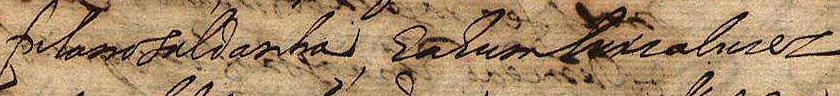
fulano saldanha, E a hum luiz alurez
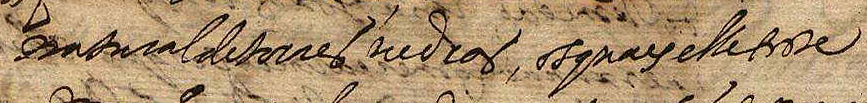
natural de torres uedras, os quaes elle teste
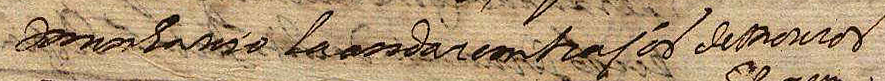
munha uio la andar em trajos de mouros
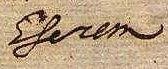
E serem
